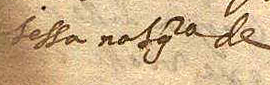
Iessa na Igra de
